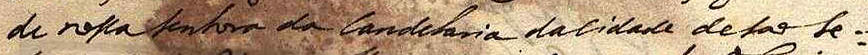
de nossa Senhora da Candelaria da cidade de saõ Se
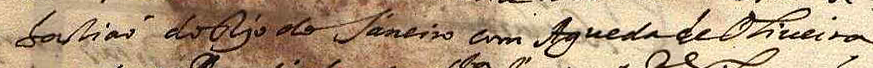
bastiaõ do Rjo do Ianeiro com Agueda de Oliueira
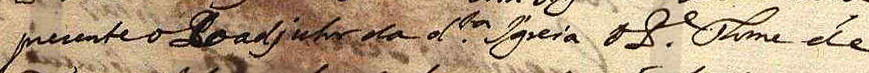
prezente o Coadjutor da d.ta Igreia o P.e Thome de
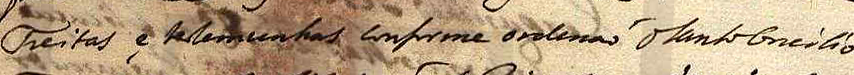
Freitas, e testemunhas conforme ordenaõ o santo concilio
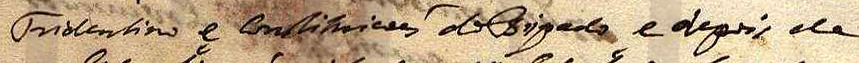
Tridentino e constituiçoes do Bispado e depois de
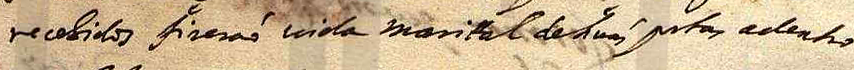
recebidos fizeraõ uida marital de huas̄ portas adentro
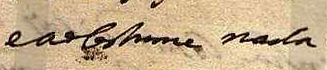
e ao Costume nada.
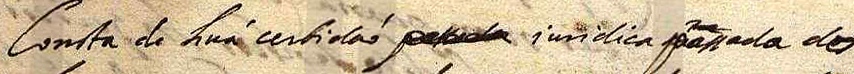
Consta de huā certidaõ passada iuridica passada dos
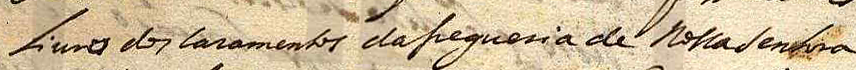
Liuros dos cazamentos da freguezia de nossa Senhora
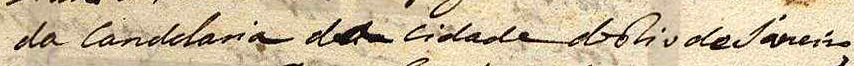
da Candelaria desta cidade do Rio de Ianeiro,
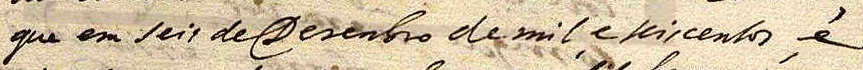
que em seis de Dezembro de mil, e seiscentos, e
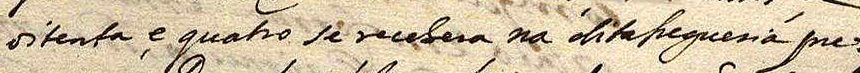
oitenta, e quatro se recebera na dita freguesia pre
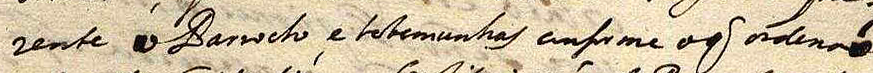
zente o Parrocho, e testemunhas conforme o q̄ ordenaõ
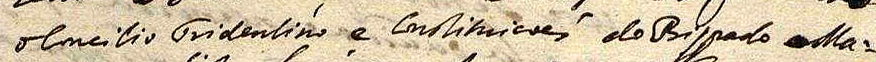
o Concilio Tridentino, e Constituiçoes do Bispado a Ma
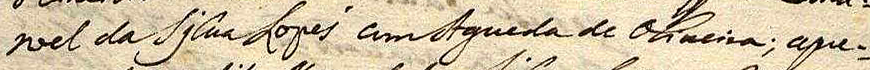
noel da Sjlua Lopes com Agueda de Oliueira; apre
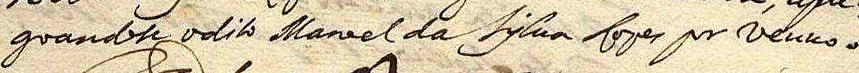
goandose o dito Manoel da Sylua Lopes por veuuo
